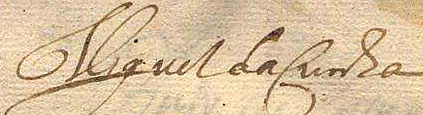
Miguel da Cunha
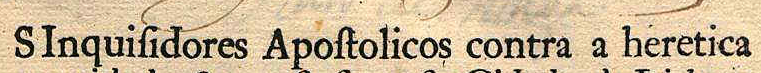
S Inquisidores Apostolicos contra a heretica
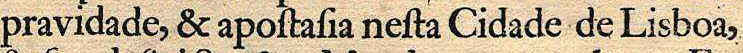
pravidade, & apostasia nesta Cidade de Lisboa,
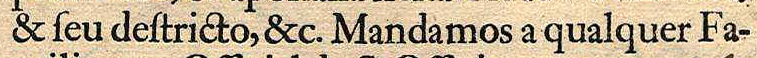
& seu destricto, &c. Mandamos a qualquer Fa
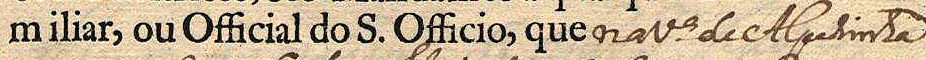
miliar, ou Official do S. Officio, que na V.a de Alpadrinha
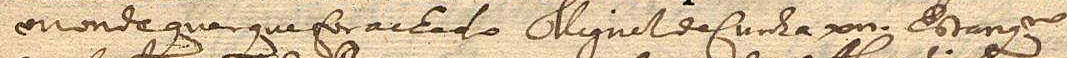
ou onde quer que for achado Miguel da Cunha xn. Estanq.ro
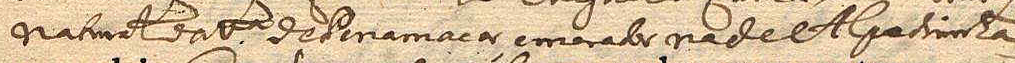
natural da v.a de Penamacor, e morador na de Alpadrinha
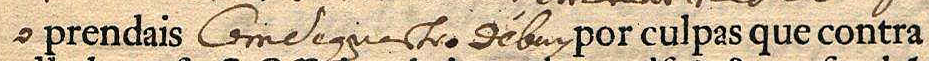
o prendais Com Sequestro de bens por culpas que contra
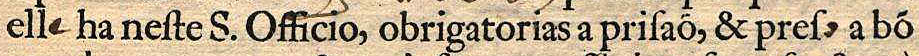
elle ha neste S. Officio, obrigatorias a prisaõ, & preso a bō
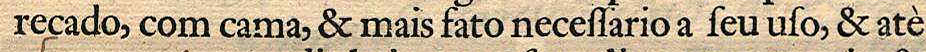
recado, com cama, & mais fato necessario a seu uso, & atè
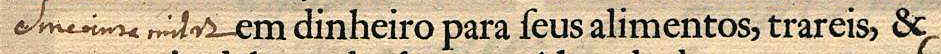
Sincoenta mil rs em dinheiro para seus alimentos, trareis, &
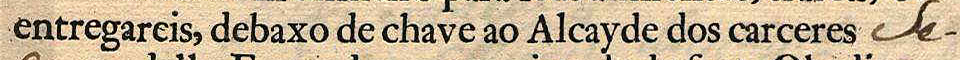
entregareis, debaxo de chave ao Alcayde dos carceres Se
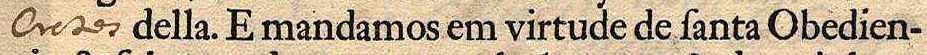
cretos della. E mandamos em virtude de santa Obedien
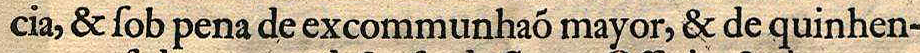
cia, & sob pena de excommunhaõ mayor, & de quinhen
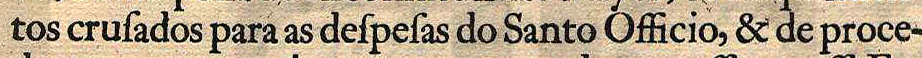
tos crusados para as despesas do Santo Officio, & de proce
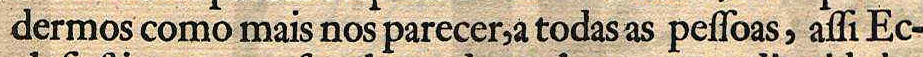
dermos como mais nos parecer, a todas as pessoas, assi Ec
